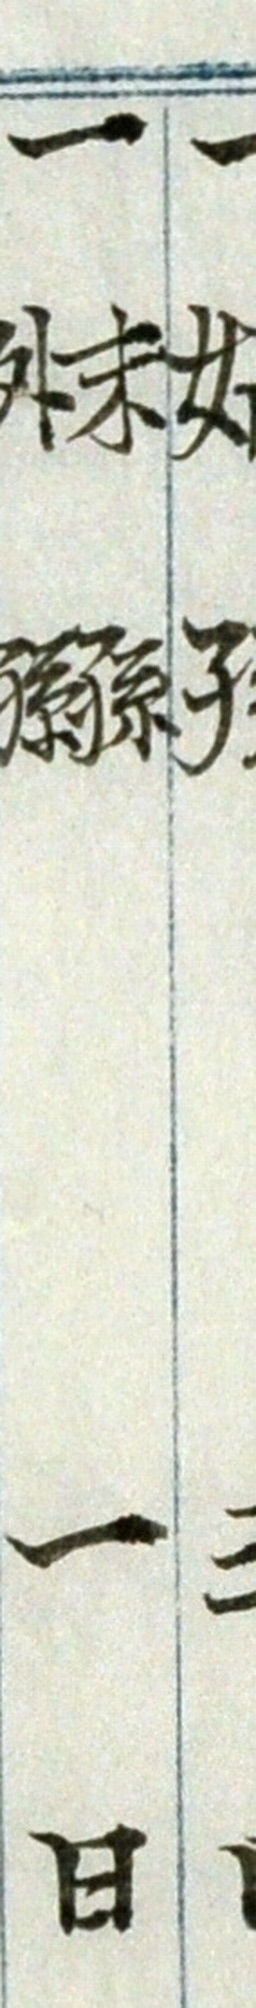一娚姪一日
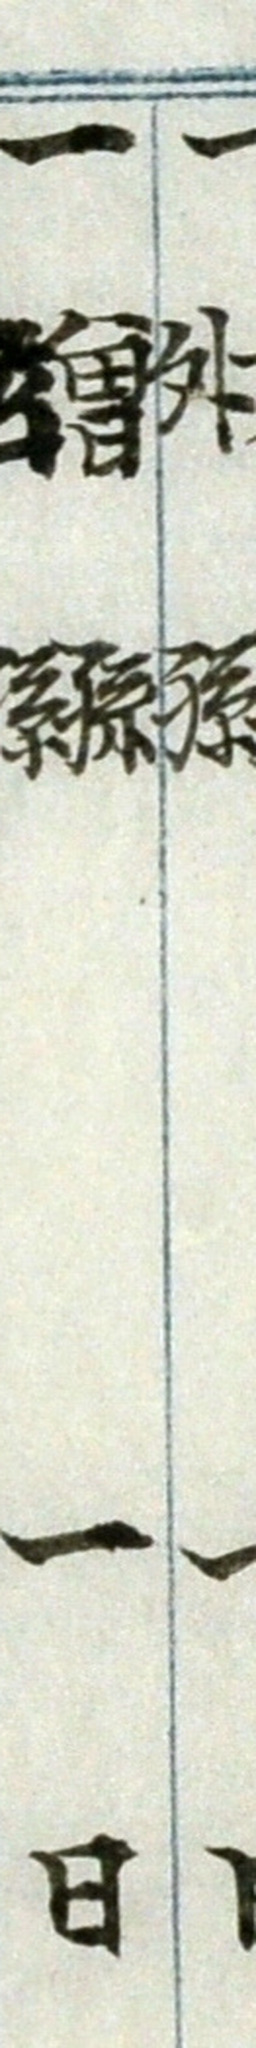一娚姪一日
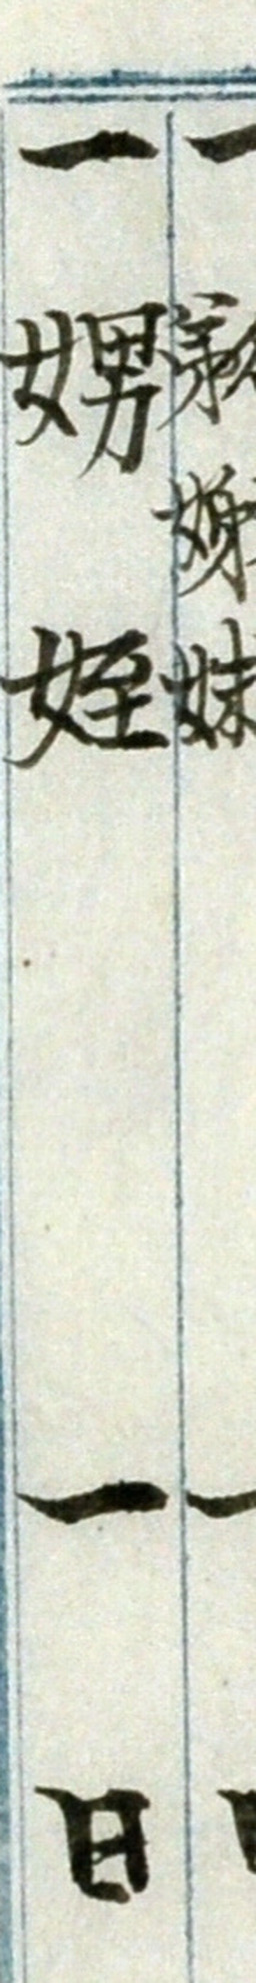一娚姪一日
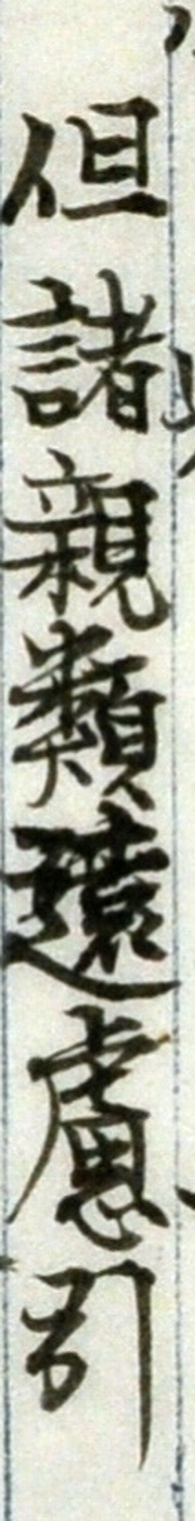但諸親類遠慮引
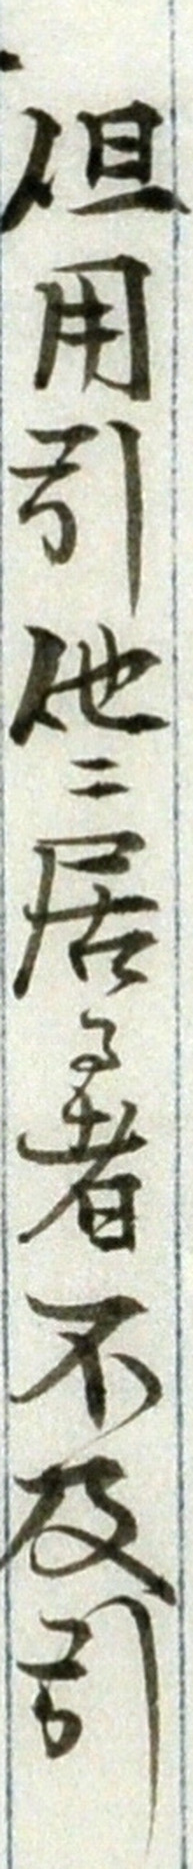但用引他ニ居る者不及引
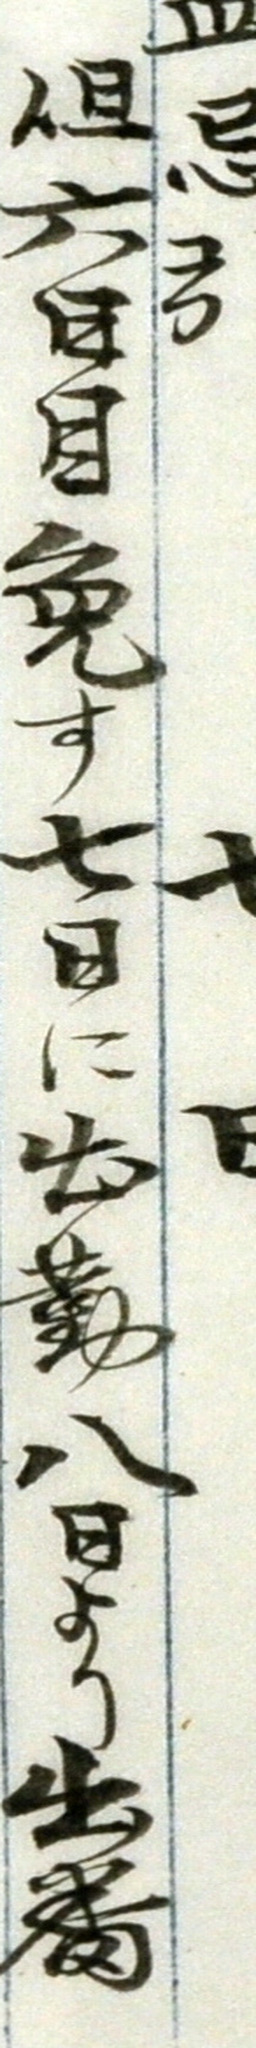但六日目免す七日に出勤八日より出番
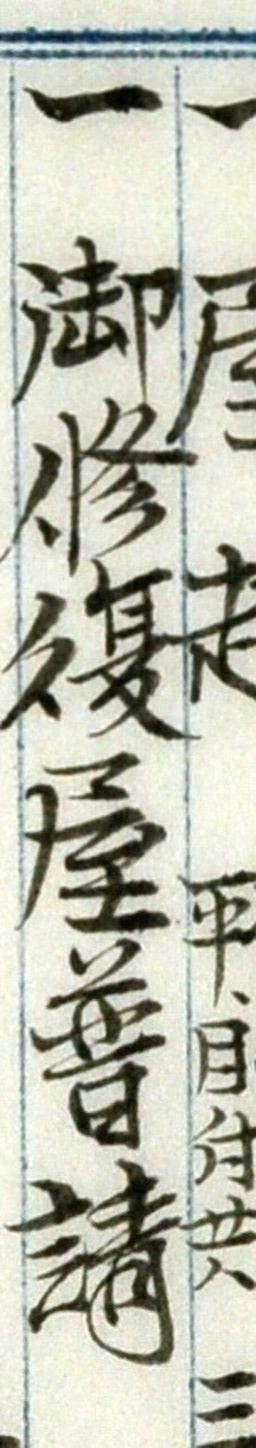一御修復屋普請

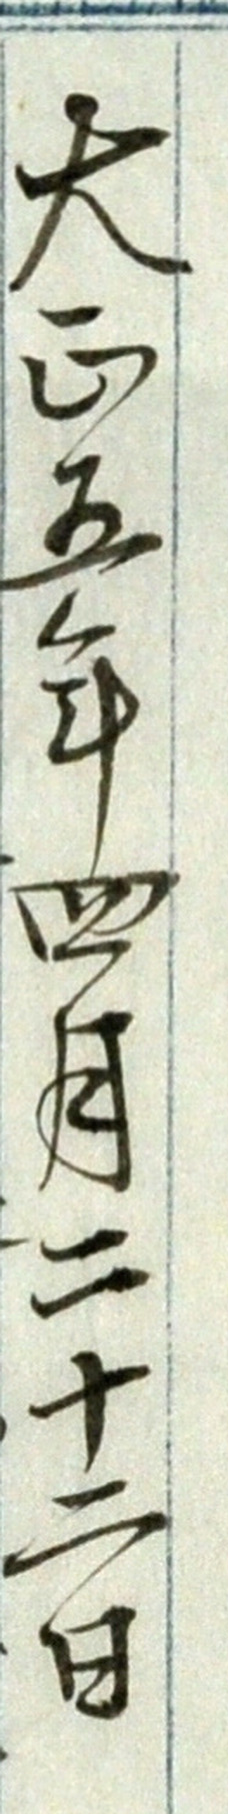大正五年四月二十二日
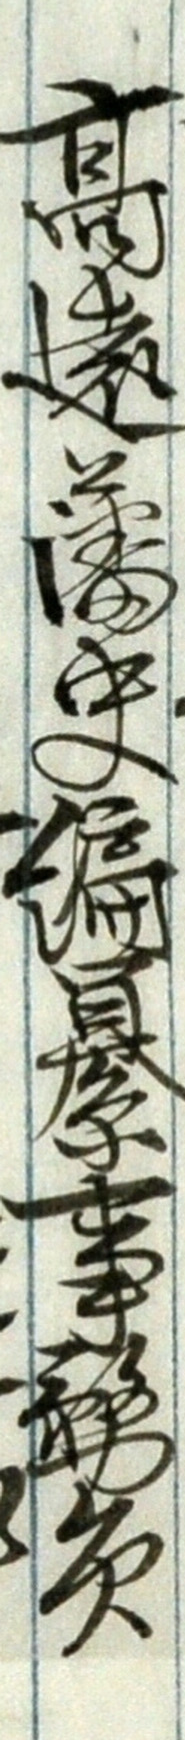高遠藩史編纂事務員
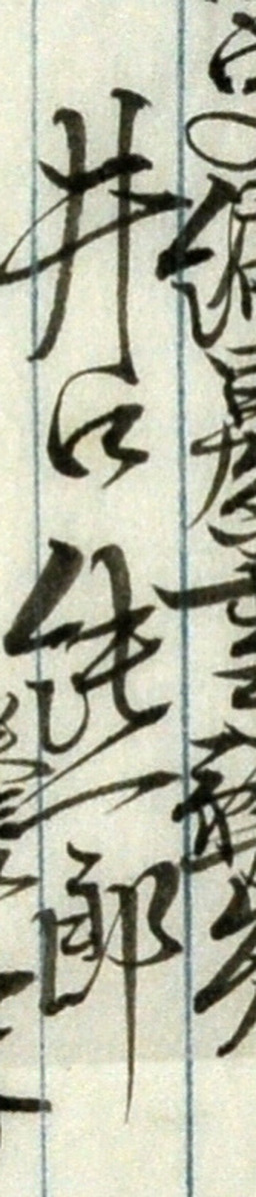井口純一郎
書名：組方忌服令
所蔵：伊那市立高遠町図書館・合同会社AMANE
